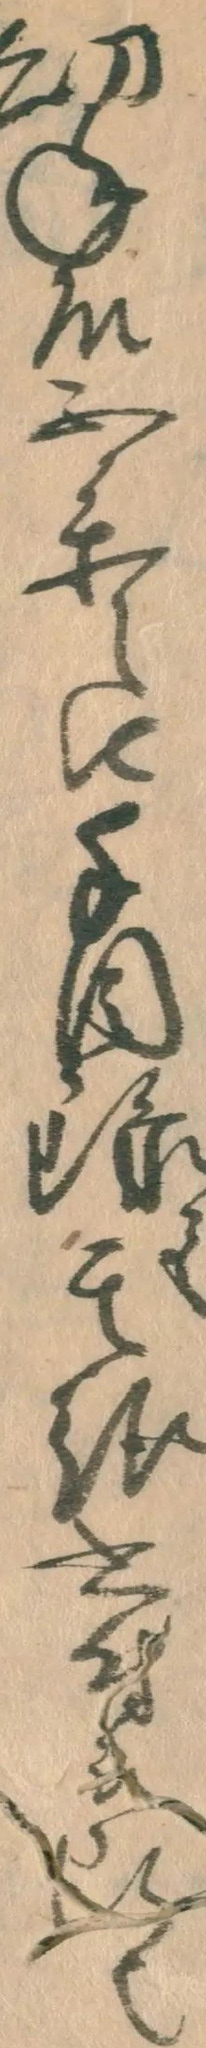幼年故不参之由手目録ニも其趣書付被致也
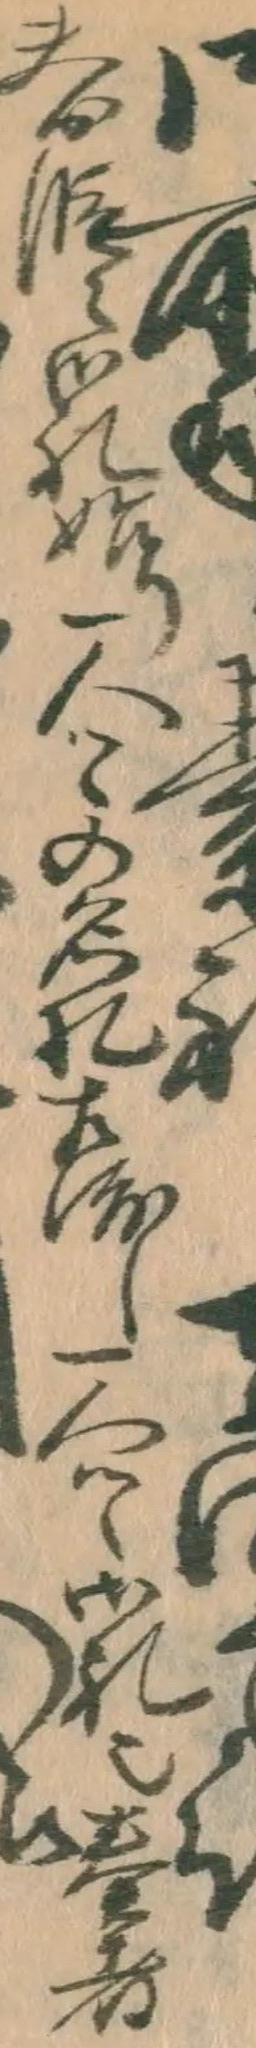夫ゟ段々御礼始り一人ツヽの名札相渡し一人ツヽ御礼也奏者
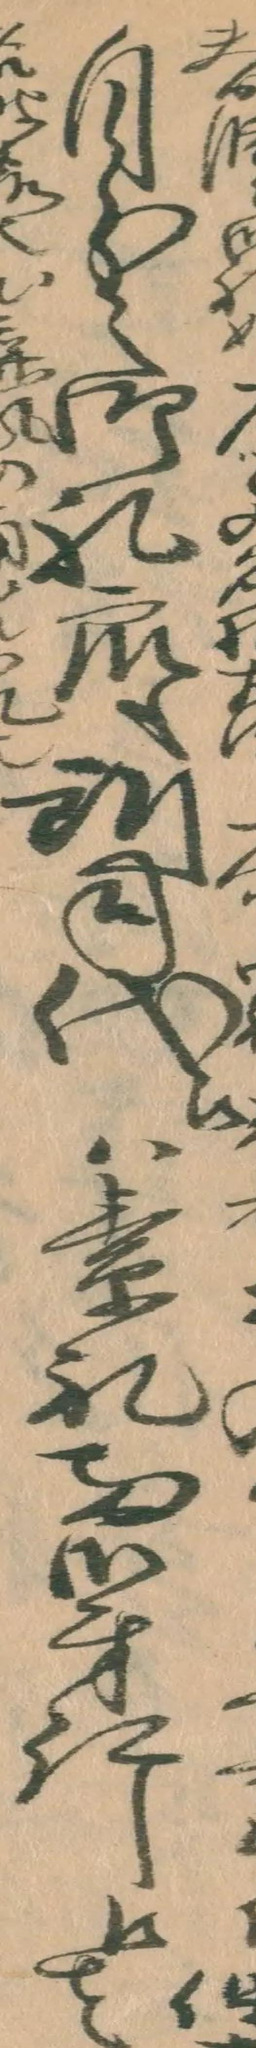自分之御礼衆も所司代江ハ素礼両御奉行江者
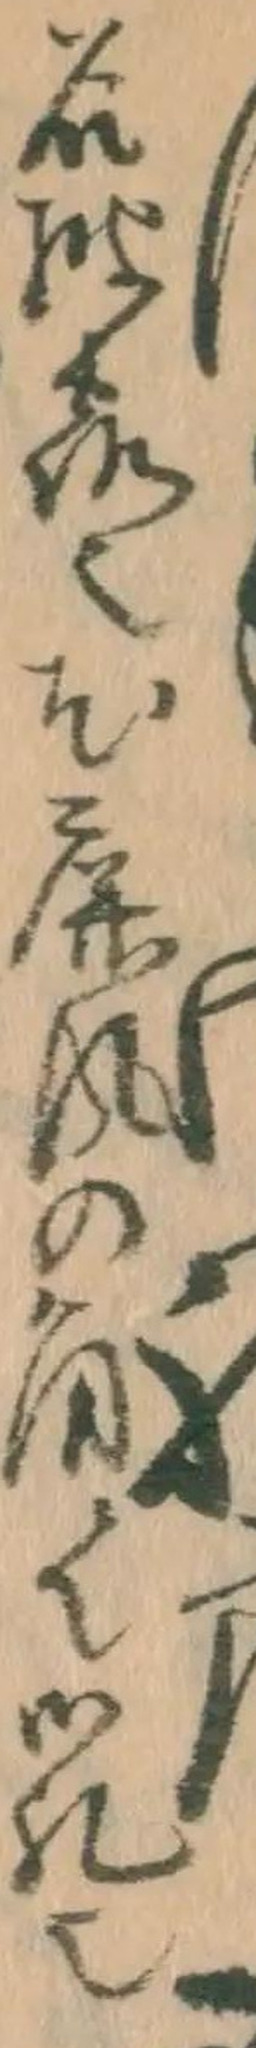各披露也尤屏風の角ニて御礼也
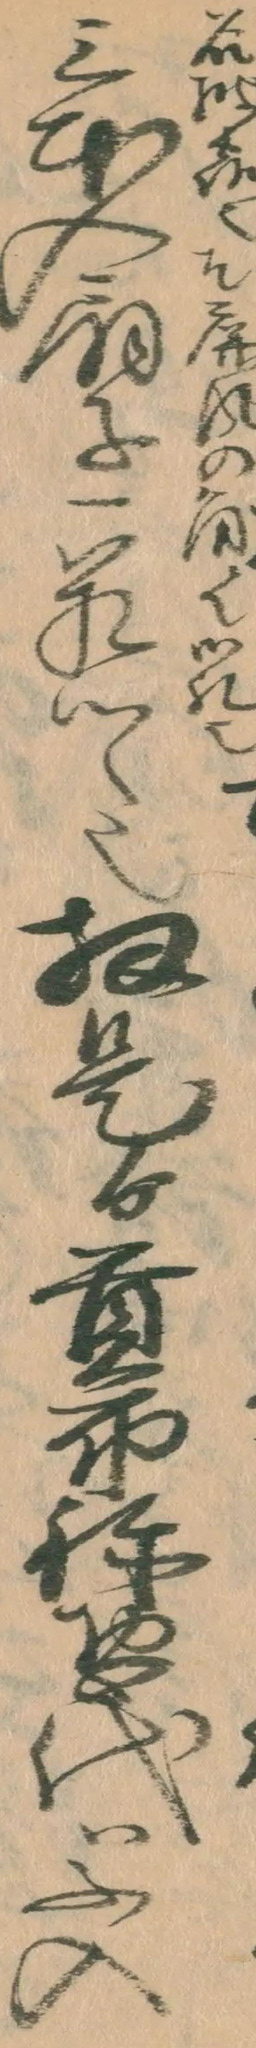三本入扇子一箱ツヽ也扨是ゟ貴布称惣代ハ不入
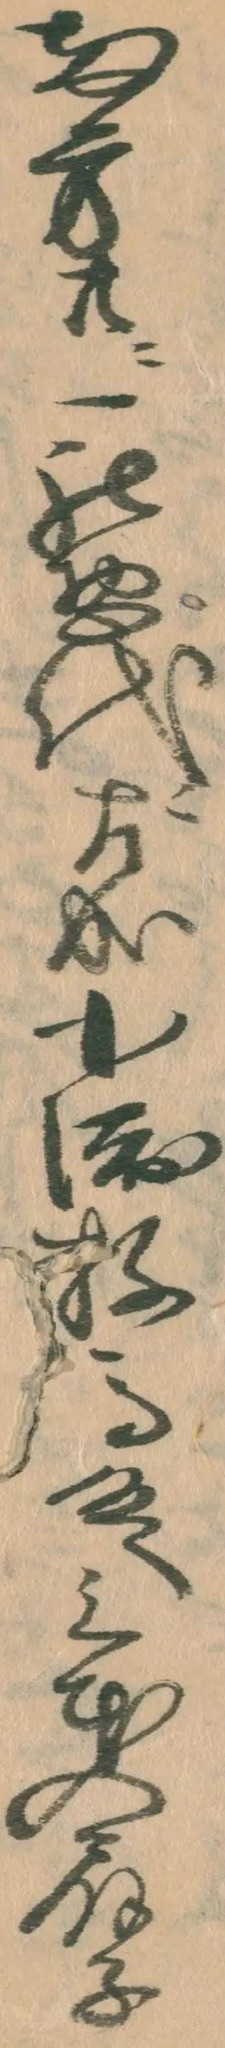両方共ニ一社惣代ニ相成小堀数馬殿へ三本入扇子
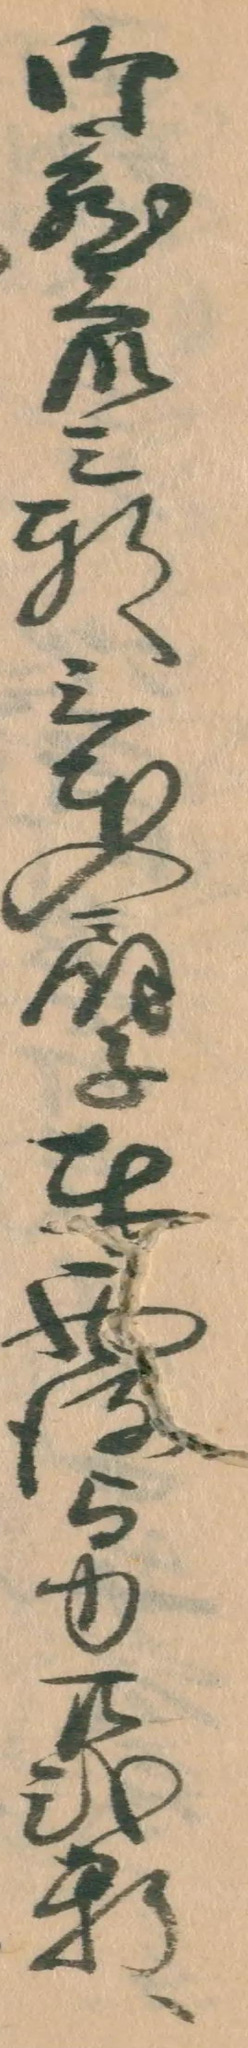御蔵衆三軒へ三本入扇子東西役与力廿弐軒へ
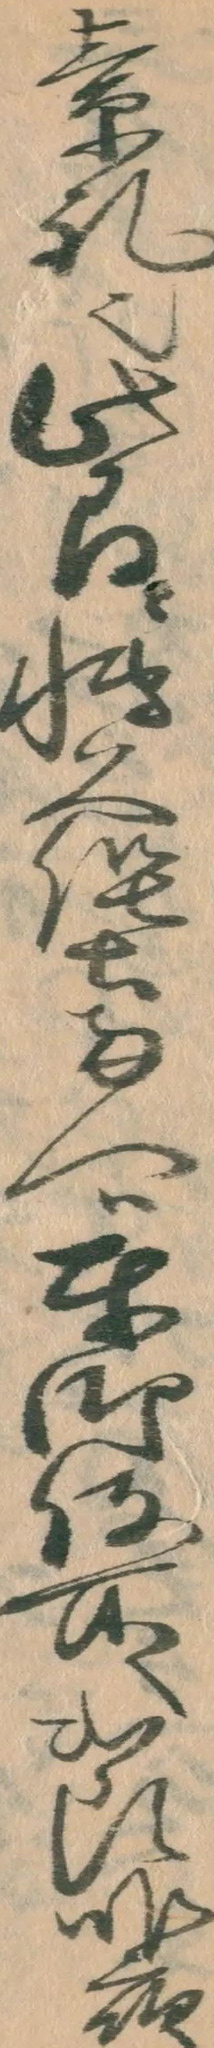素礼也此間ニ博久保土両人ハ東御役所へ出頭昨夜
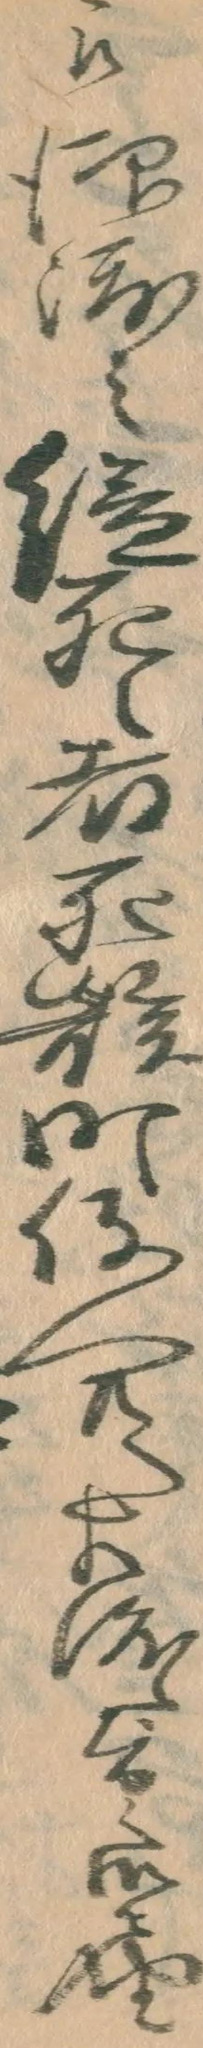被仰渡之縊死之者死骸町役人共へ相渡候旨之御届
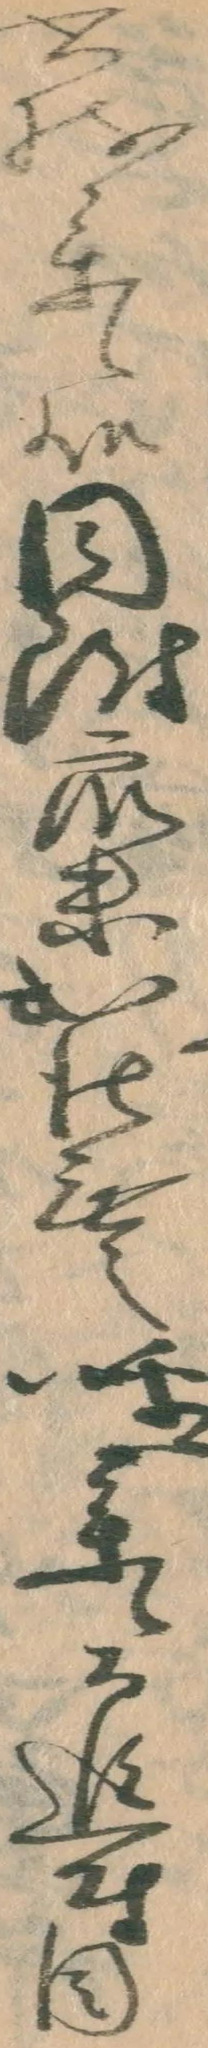書持参候処目付衆未出仕無之呼ニ参候而追付目
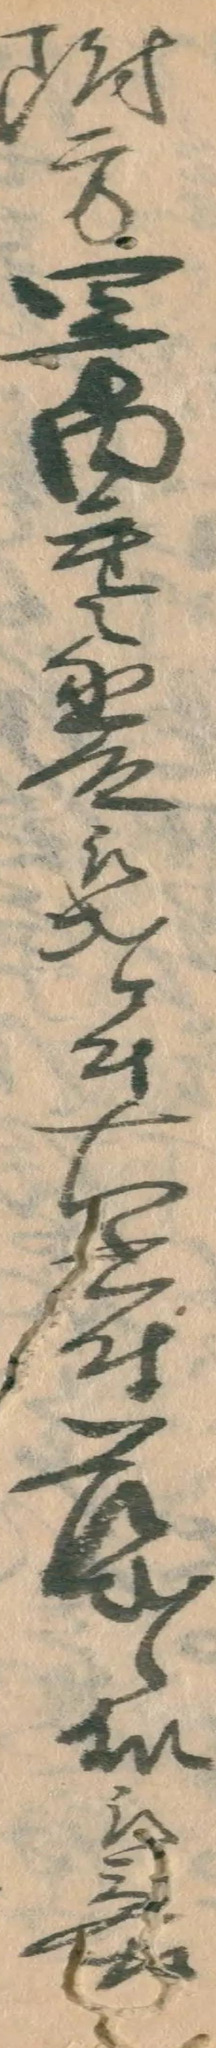付方四方内重之丞殿被出候付右書付差出候処被受取
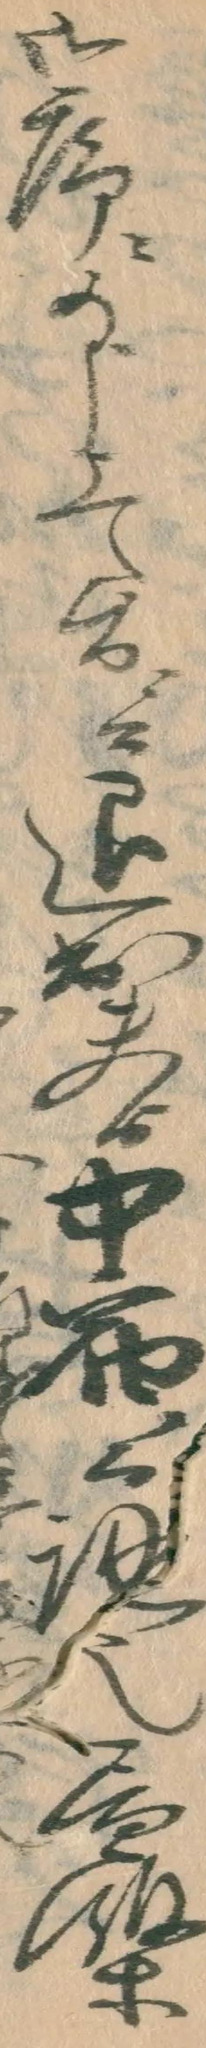御序ニ可申上候旨ニ而退出夫ゟ中宿ニ而認也昼飯等
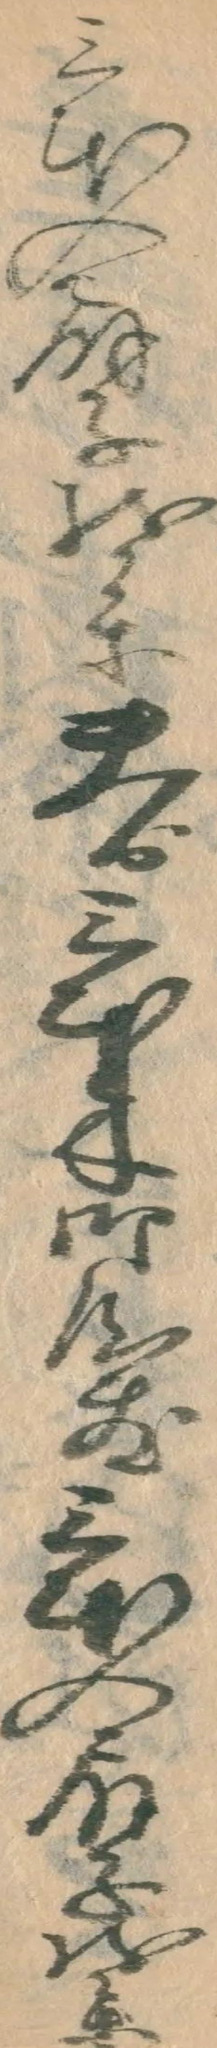三本入扇子持参夫ゟ三本木御屋敷三本入扇子持参
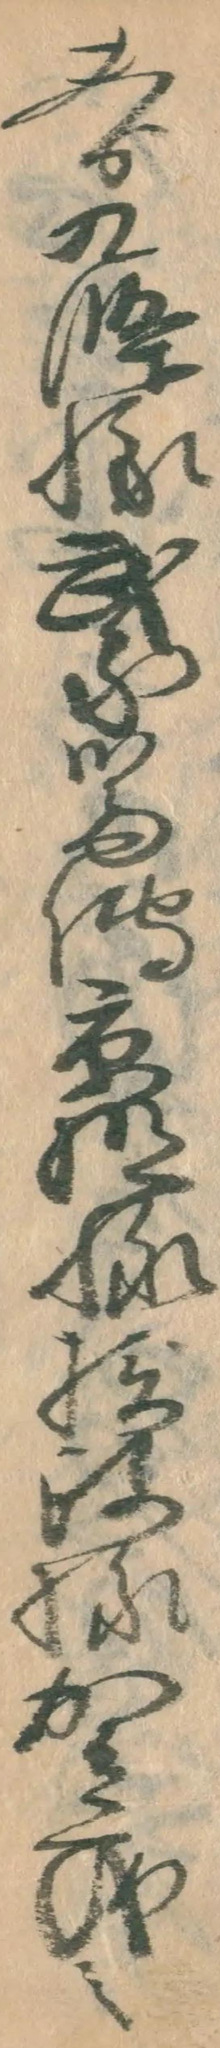夫ゟ九條様武家伝京極様摂政様賀茂之

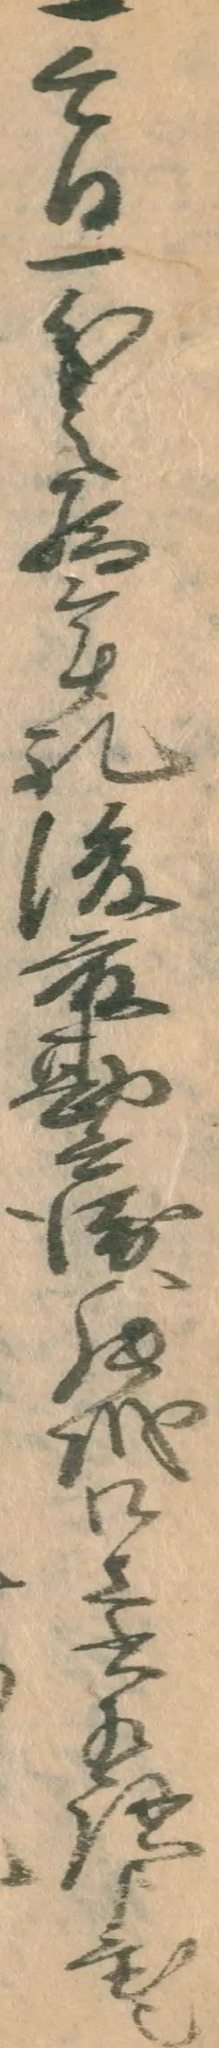一今日一分之為年礼後藤勘兵衛へ罷越口上書相認申置也
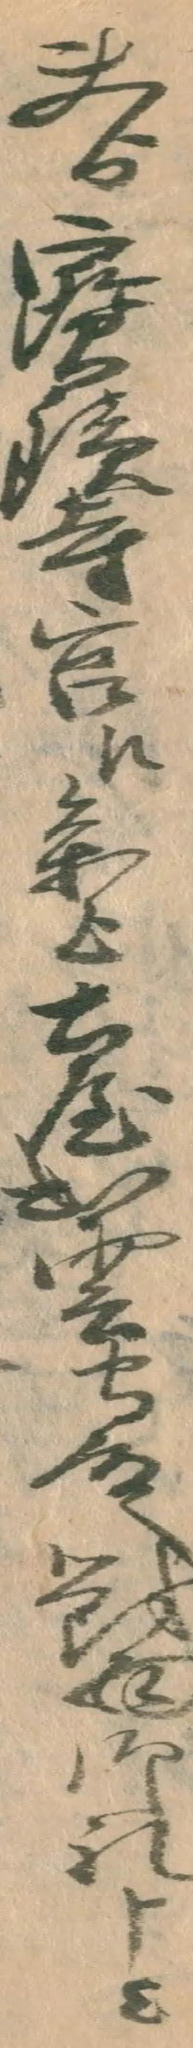夫ゟ宝鏡寺宮江参上土屋出雲守殿へ対面御礼申上
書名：賀茂社記録. 第60冊
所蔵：国立国会図書館 National Diet Library, JAPAN
